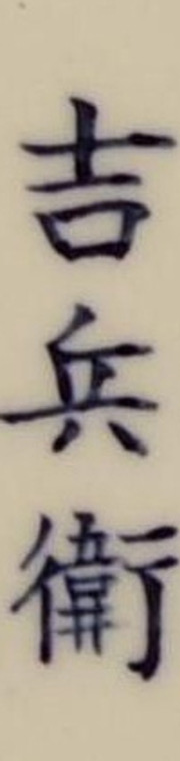吉兵衛
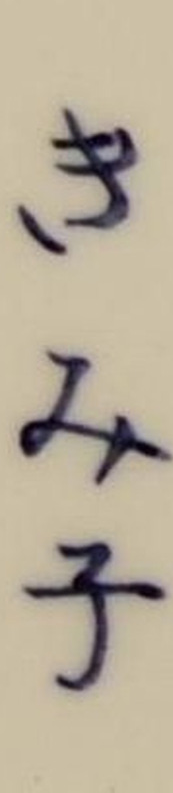きみ子

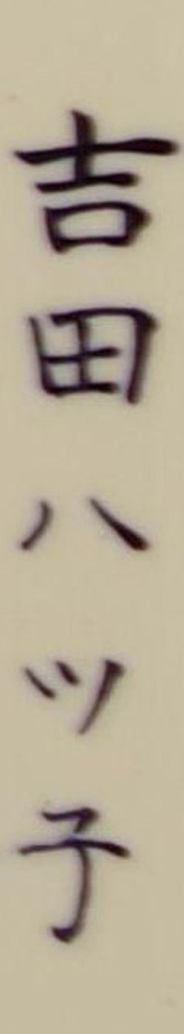吉田ハツ子
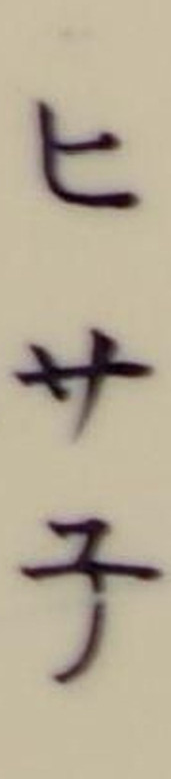ヒサ子
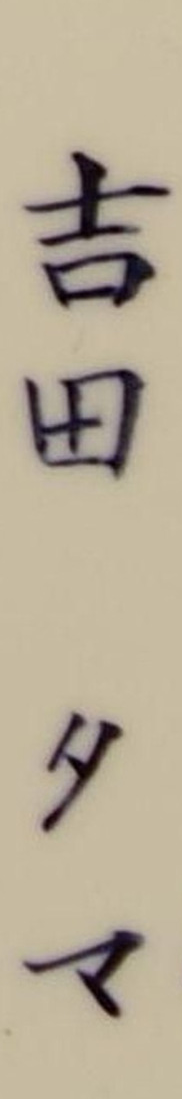吉田タマ
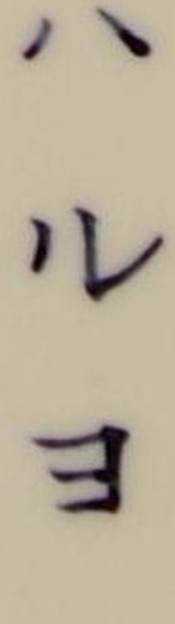ハルヨ
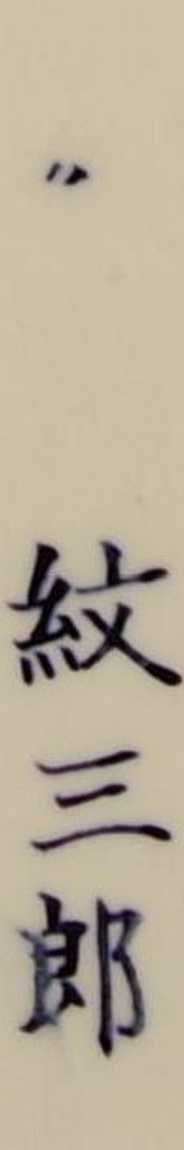紋三郎
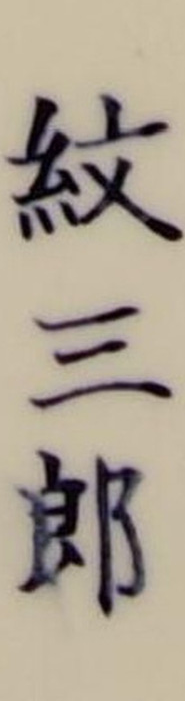紋三郎
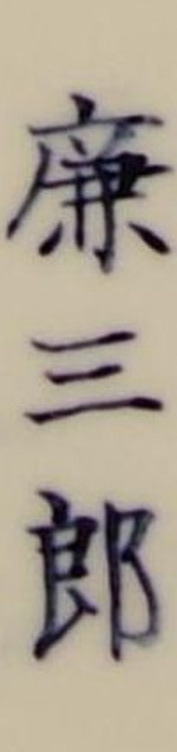紋三郎
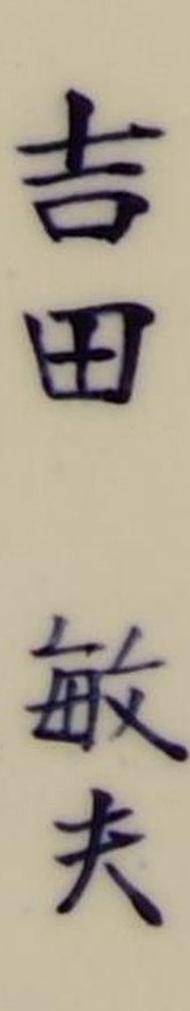吉田敏夫
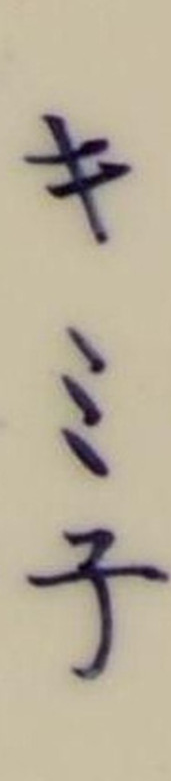キミ子
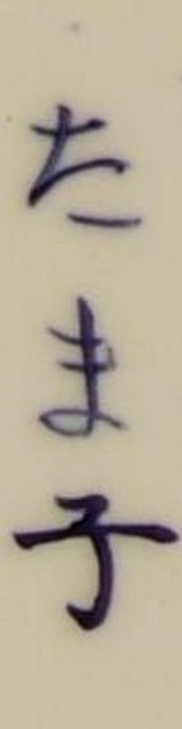たま子
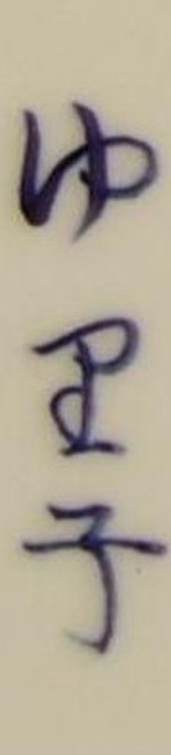ゆり子

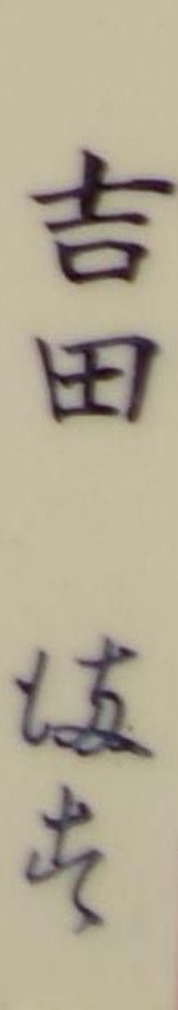吉田ます
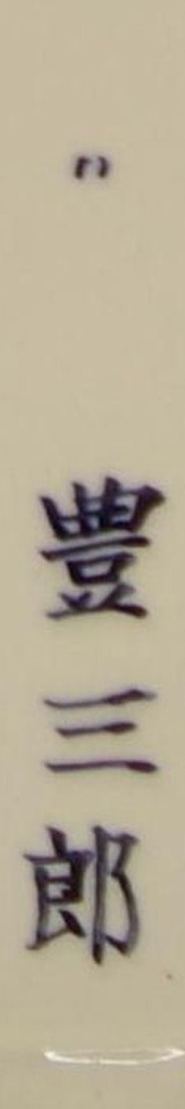豊三郎
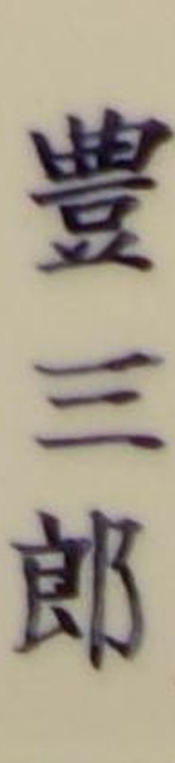豊三郎
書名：E~L
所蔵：高野山金剛峯寺
